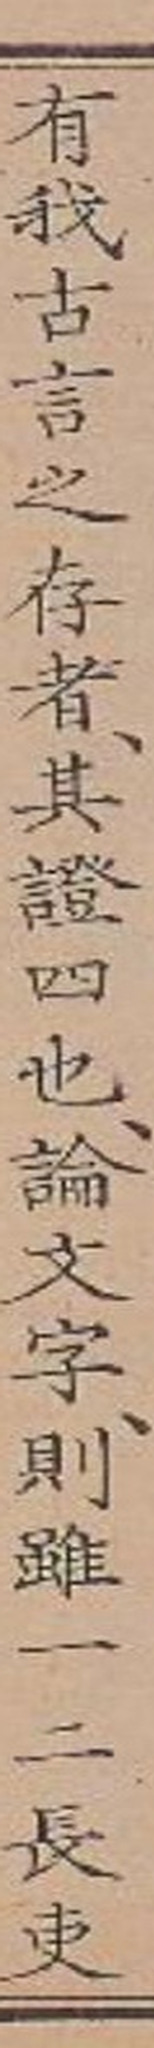有我古言之存者、其証四也、論文字、則雖一二長吏
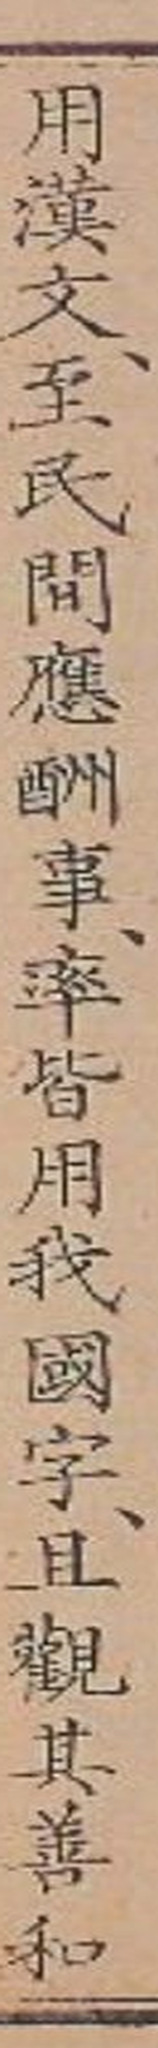用漢文、至民間応酬事、率皆用我国字、且観其善和
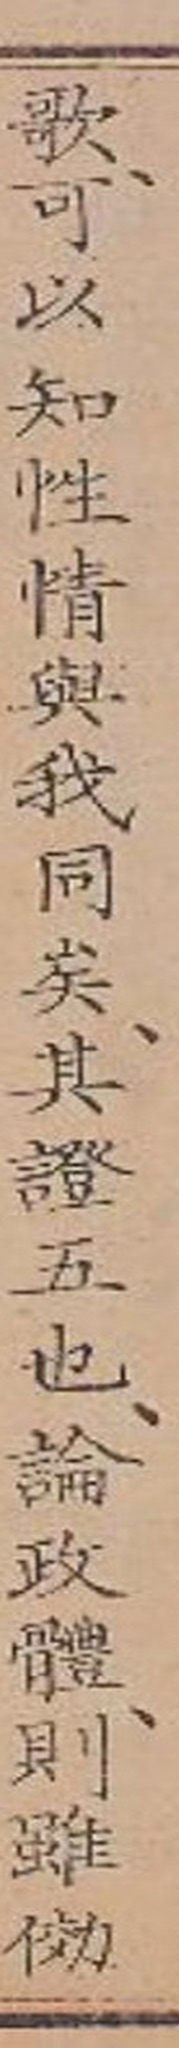歌、可以知性情与我同矣、其証五也、論政体、則雖俲
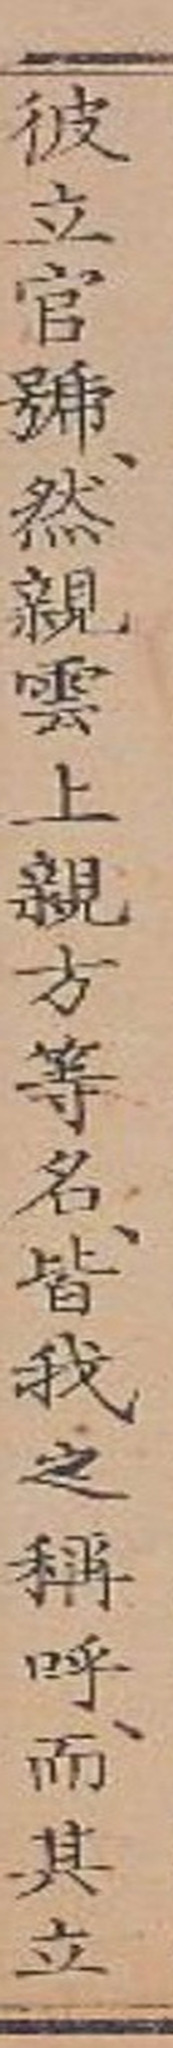彼立官号、然親雲上親方等名、皆我之称呼、而其立
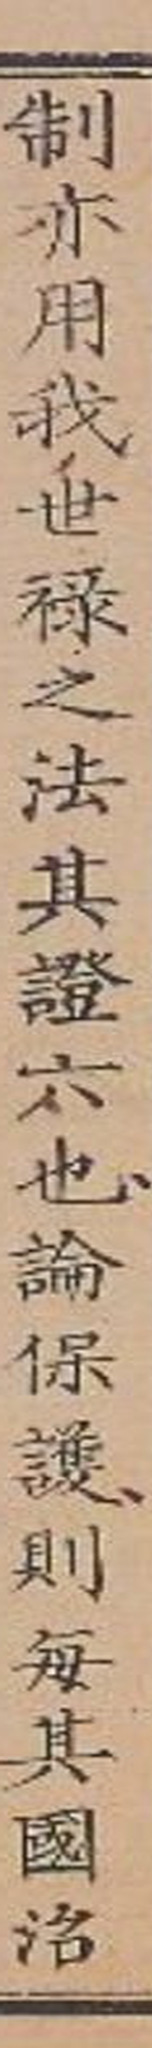制亦用我世禄之法其証六也、論保護、則毎其国治
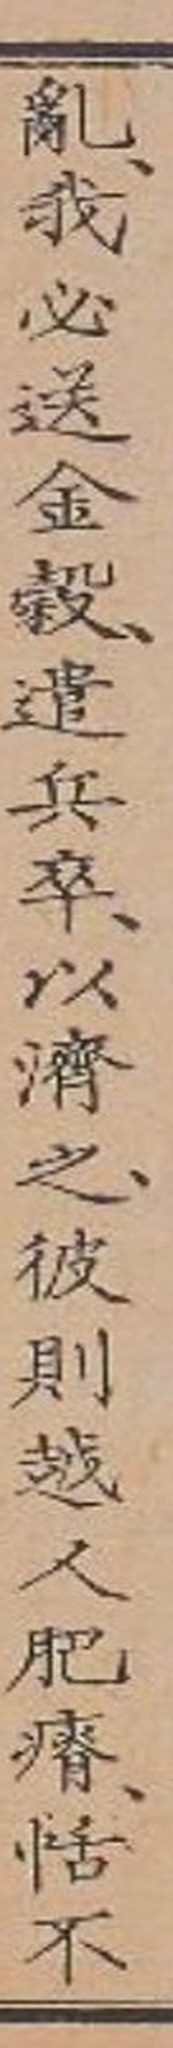乱、我必送金穀、遣兵卒、以済之、彼則越人肥瘠、恬不
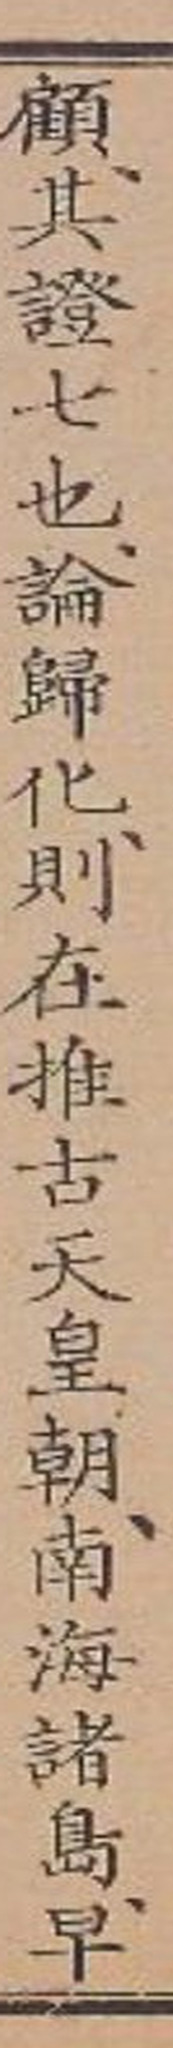顧、其証七也、論帰化、則在推古天皇朝、南海諸島、早
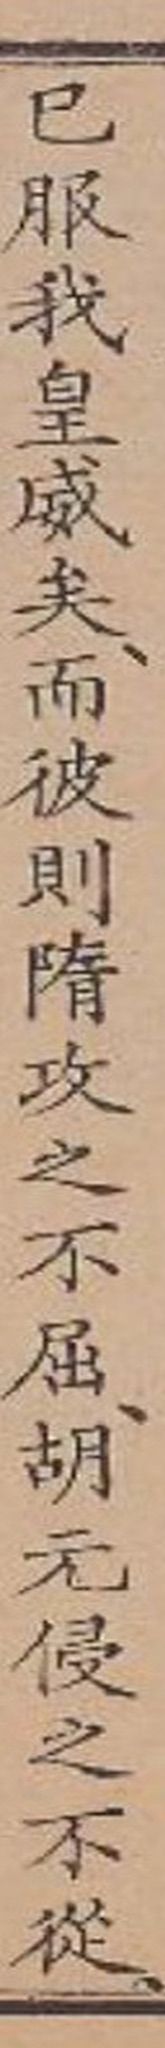巳服我皇威矣、而彼則隋攻之不屈、胡元侵之不従、
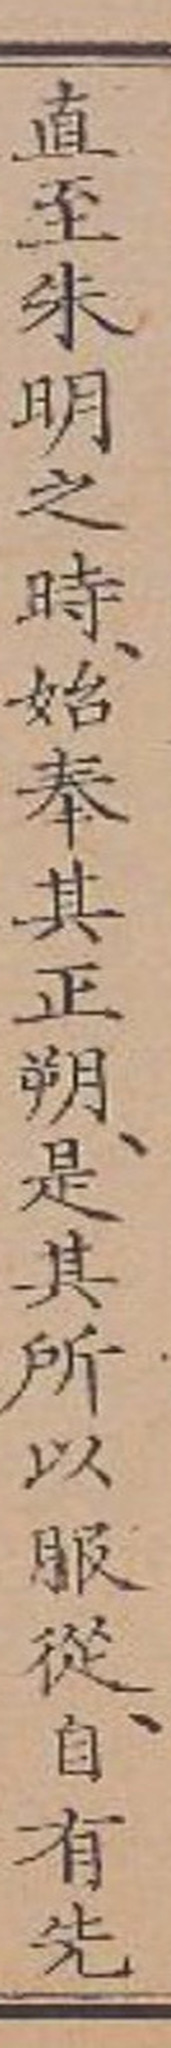直至朱明之時、始奉其正朔、是其所以服従、自有先
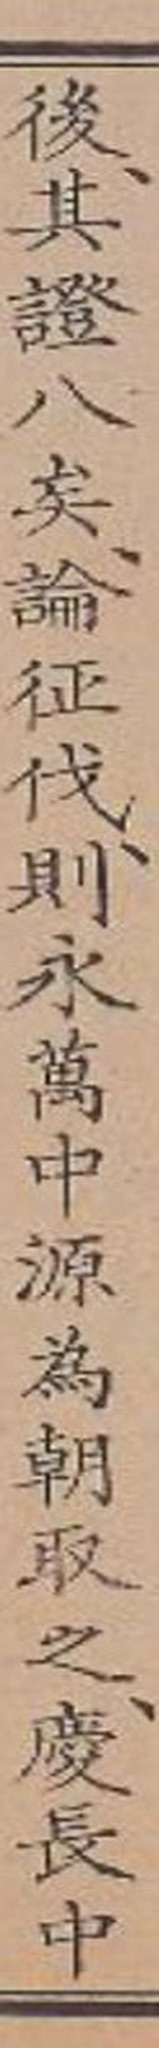後、其証八矣、論征伐、則永万中源為朝取之、慶長中
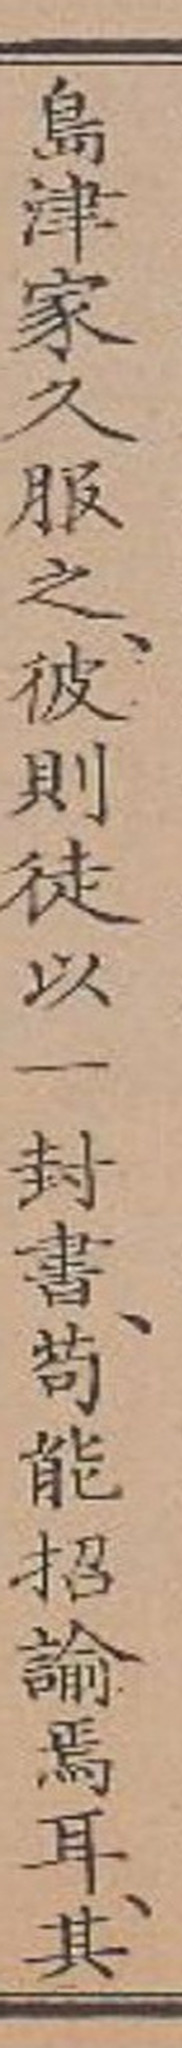島津家久服之、彼則徒以一封書、苟能招諭焉耳、其
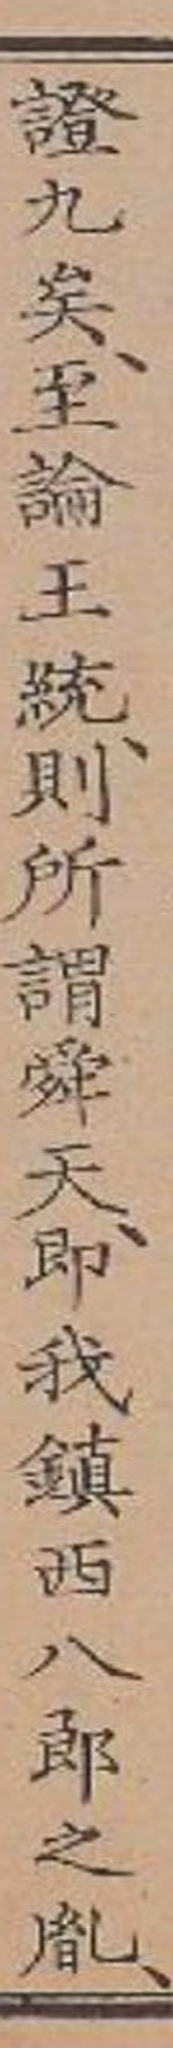証九矣、至論王統、則所謂舜天、即我鎮西八郎之胤、
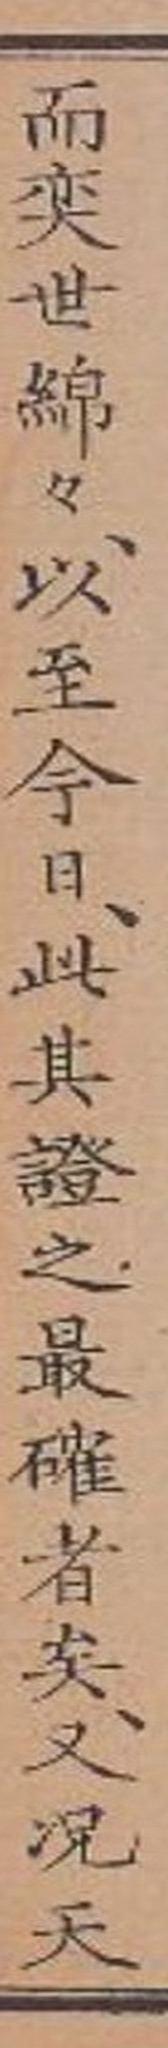而奕世綿々、以至今日、此其証之最確者矣、又況天

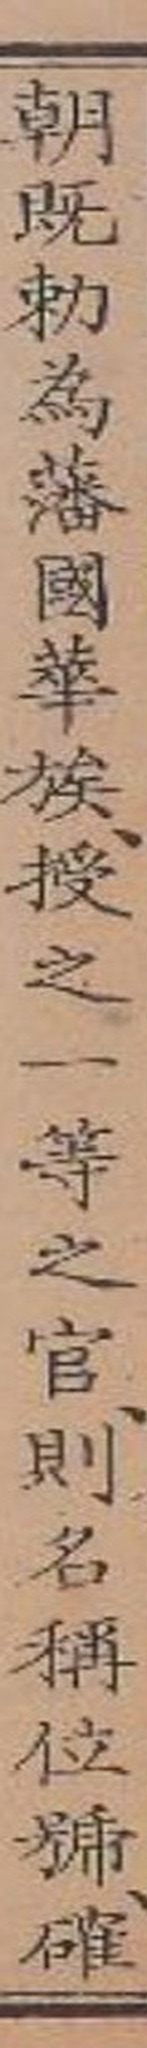朝既勅為藩国華族、授之一等之官、則名称位号、確
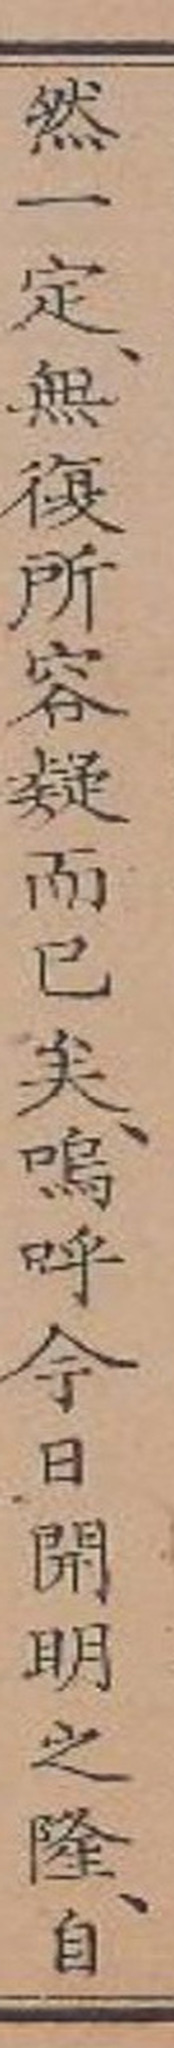然一定、無復所容疑而已矣、嗚呼今日開明之隆、自
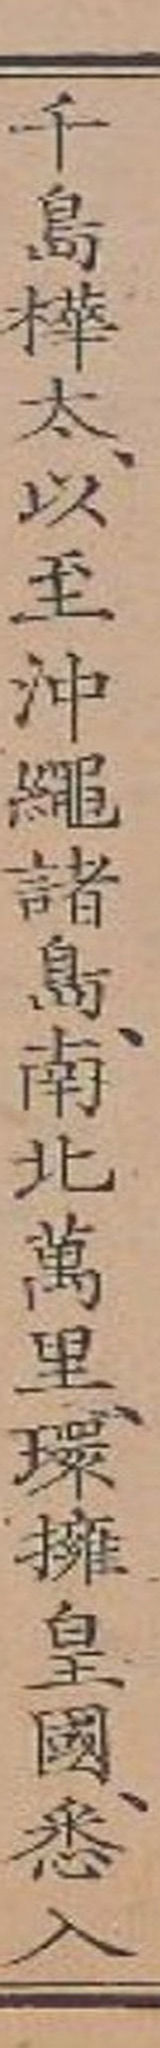千島樺太、以至沖縄諸島、南北万里、環擁皇国、悉入
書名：琉球新誌 巻上
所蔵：University of the Ryukyus Library
